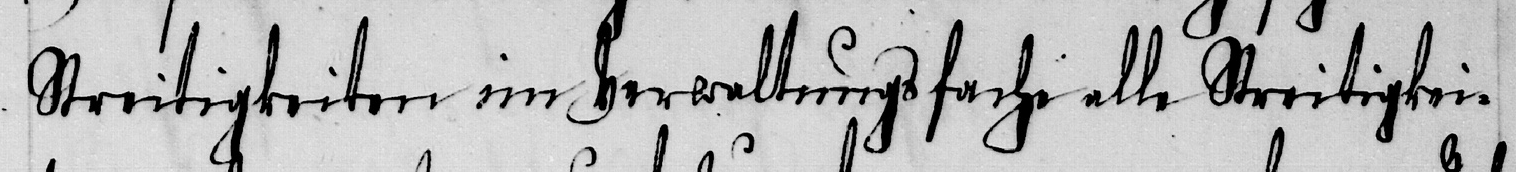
Streitigkeiten im Verwaltungsfache alle Streitigkei¬
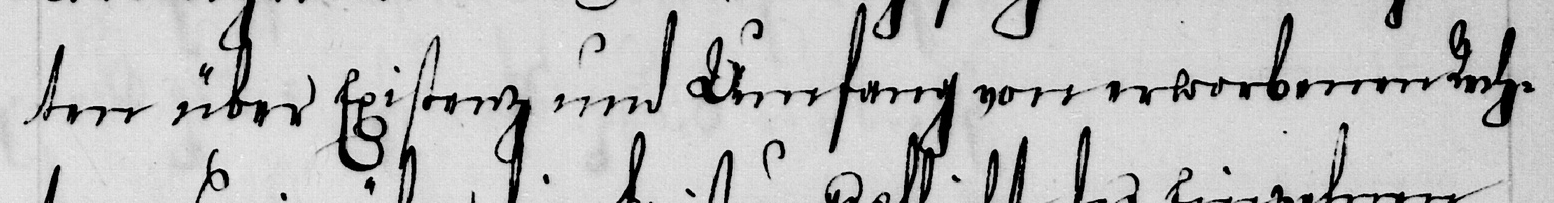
ten über Existenz und Umfang von erworbenen Rech¬
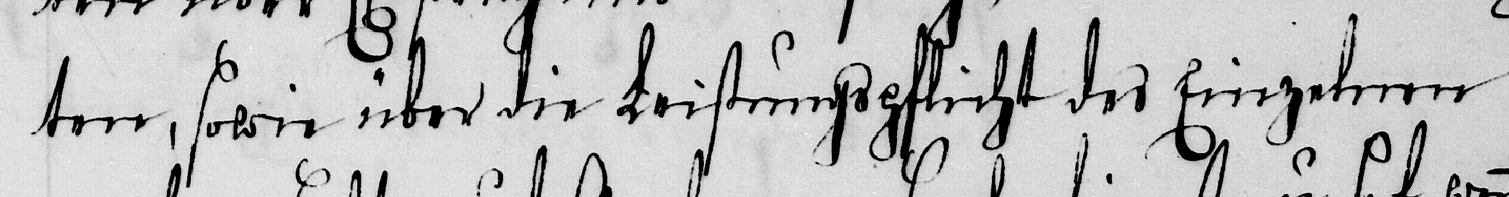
ten, sowie über die Leistungspflicht des Einzelnen
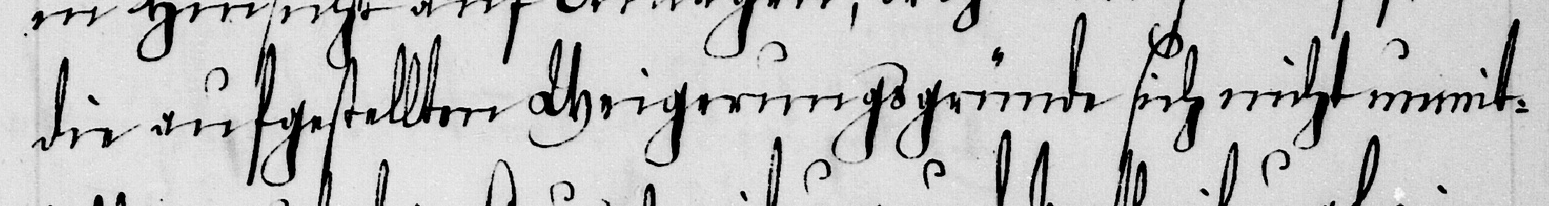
die aufgestellten Weigerungsgründe sich nicht unmit¬
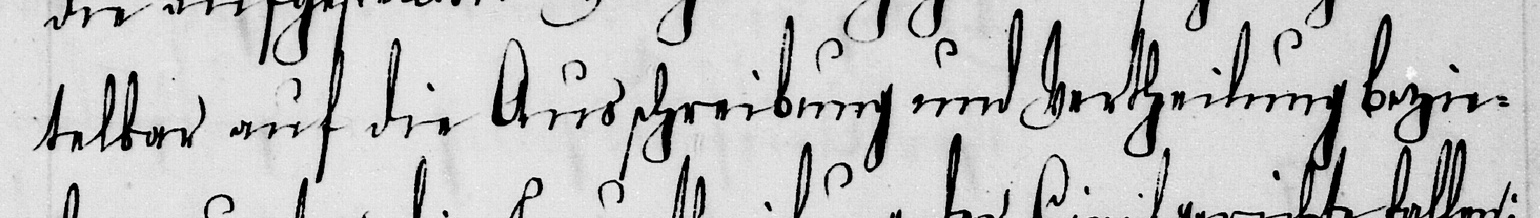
telbar auf die Ausschreibung und Vertheilung bezie¬
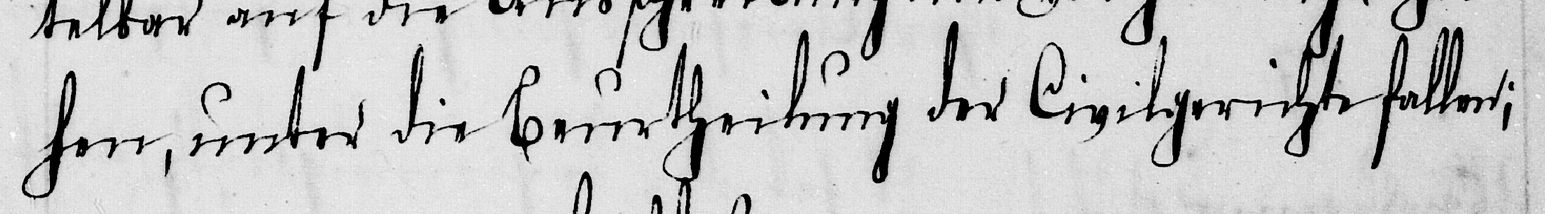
hen, unter die Beurtheilung der Civilgerichte fallen;
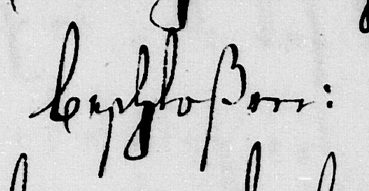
beschloßen:
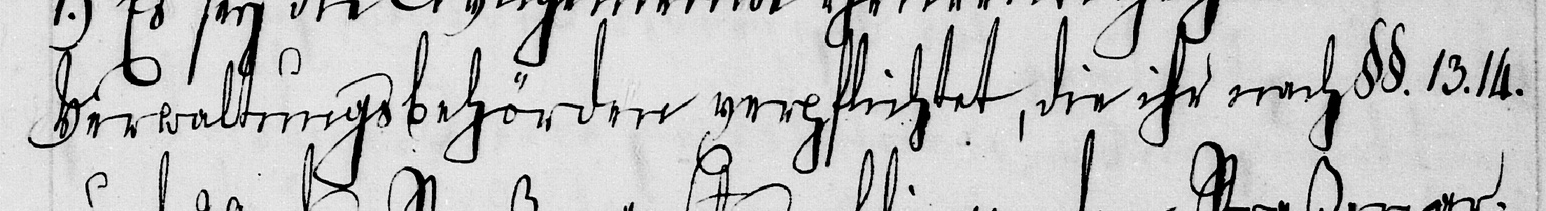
Verwaltungsbehörden verpflichtet, die ihr nach §§. 13.
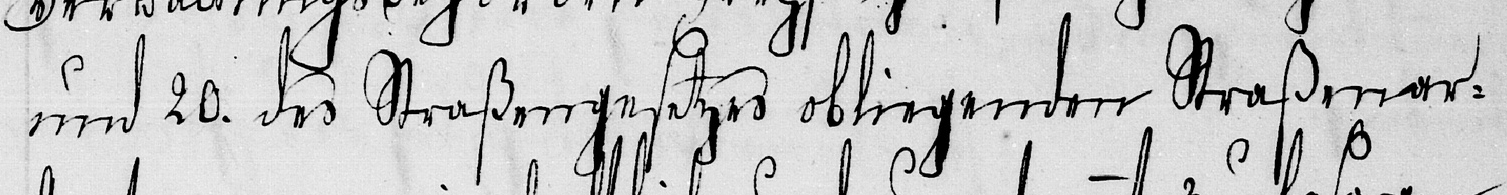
und 20. des Straßengesetzes obliegenden Straßenar¬
